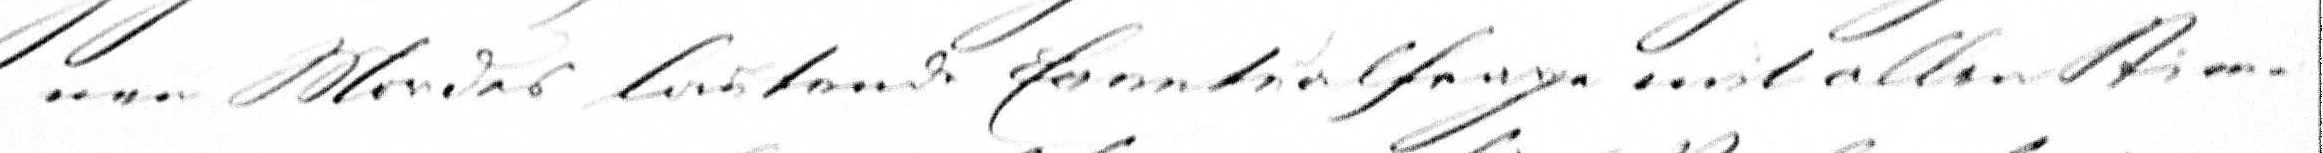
nen Mordes lautende Eventualfrage mit allen Stim¬
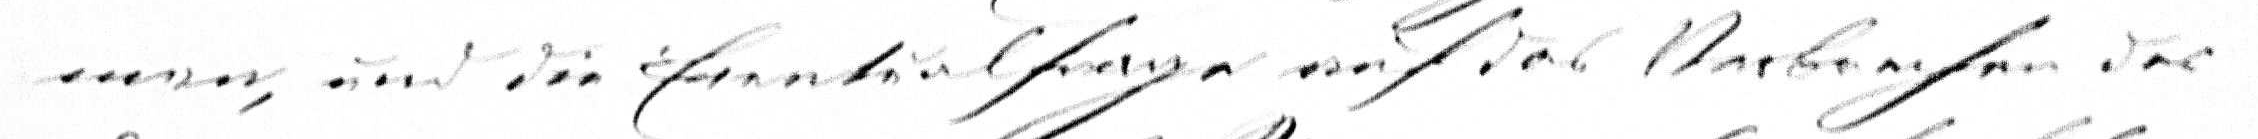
men, und die Eventualfrage auf das Verbrechen des
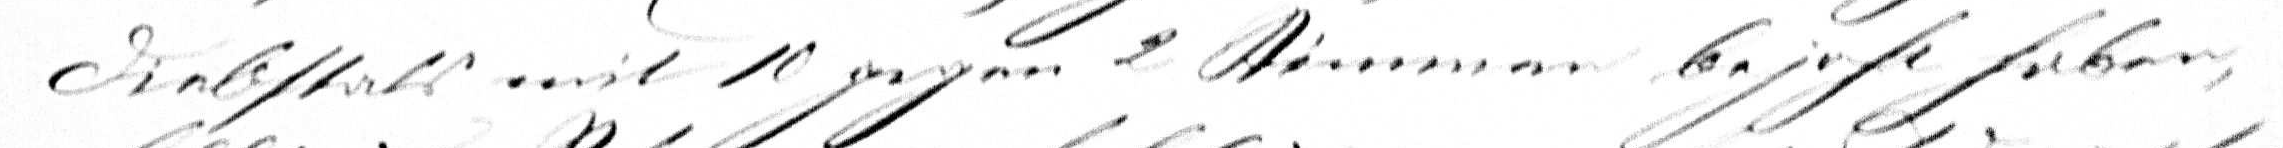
Diebstals mit 10 gegen 2 Stimmen bejaht haben,
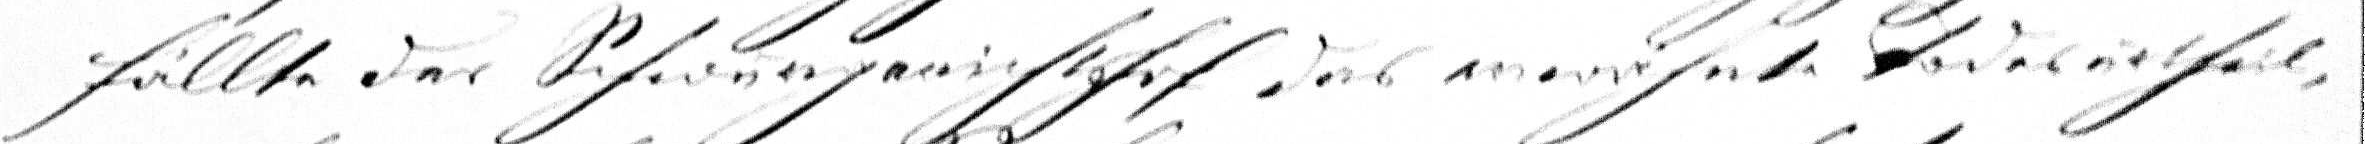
fällte der Schwurgerichtshof das erwähnte Todesurtheil,
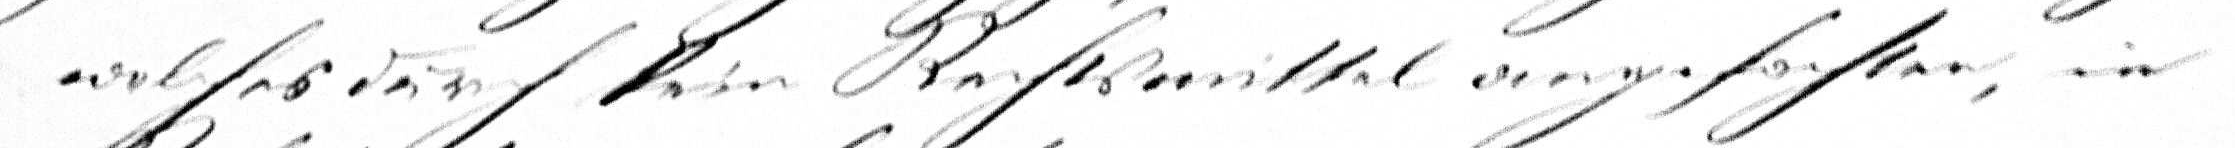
welches durch kein Rechtsmittel angefochten, in
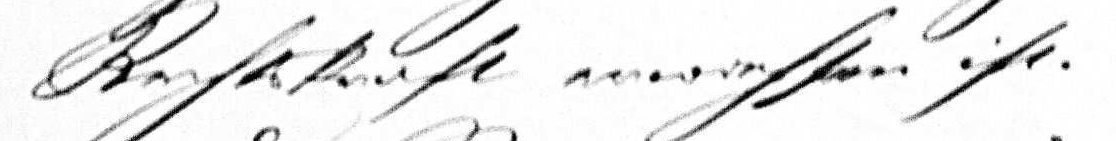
Rechtskraft erwachsen ist.
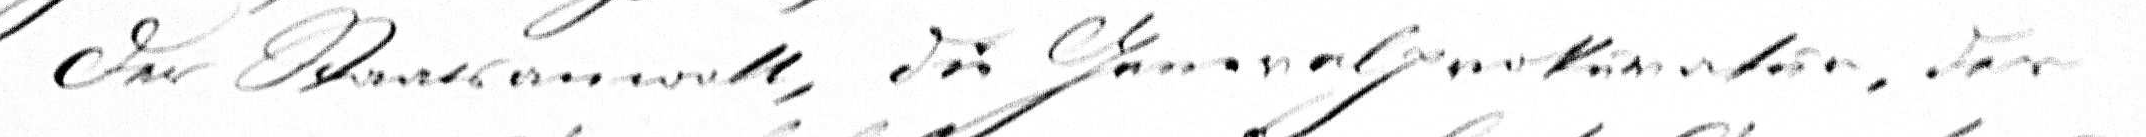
Der Staatsanwalt, die Generalprokuratur, der
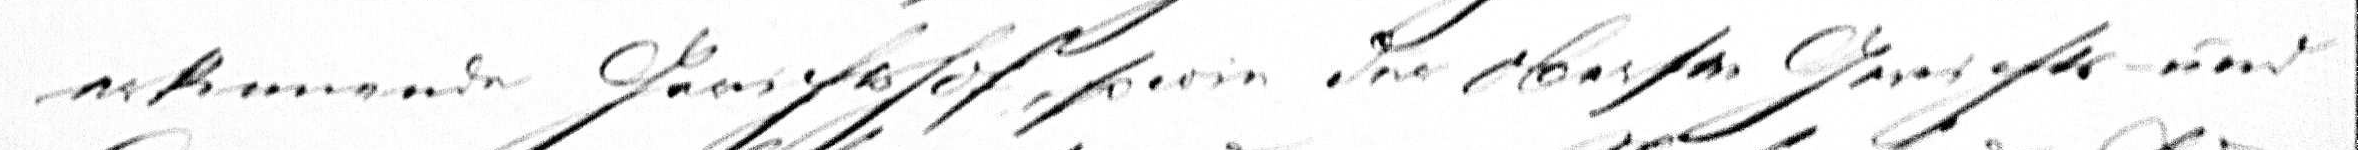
erkennende Gerichtshof, sowie der oberste Gerichts- und
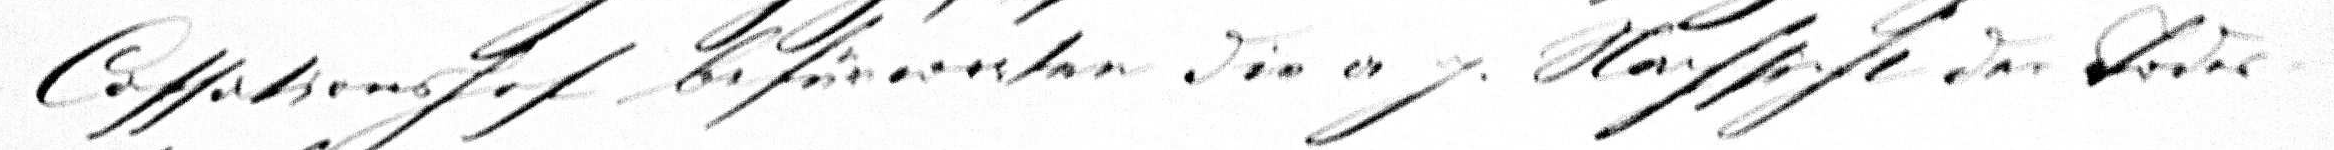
Cassationshof befürworten die a.g. Nachsicht der Todes¬
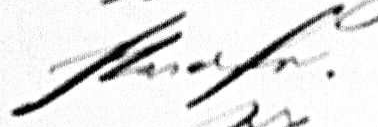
strafe.
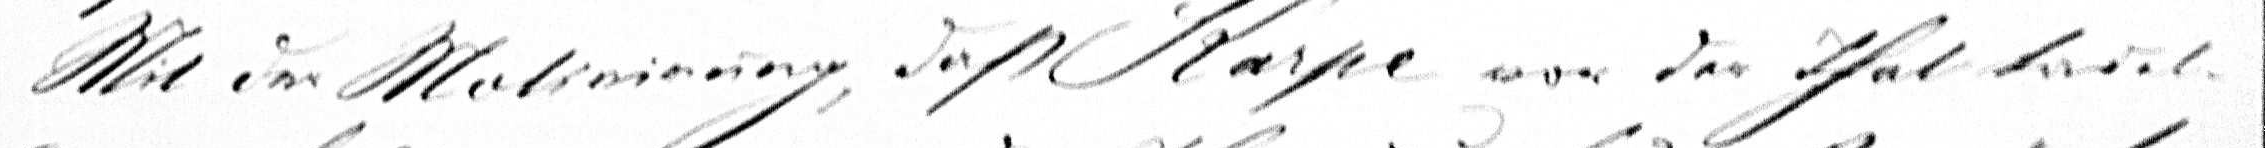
Mit der Motivirung, daß Karpe vor der That tadel¬
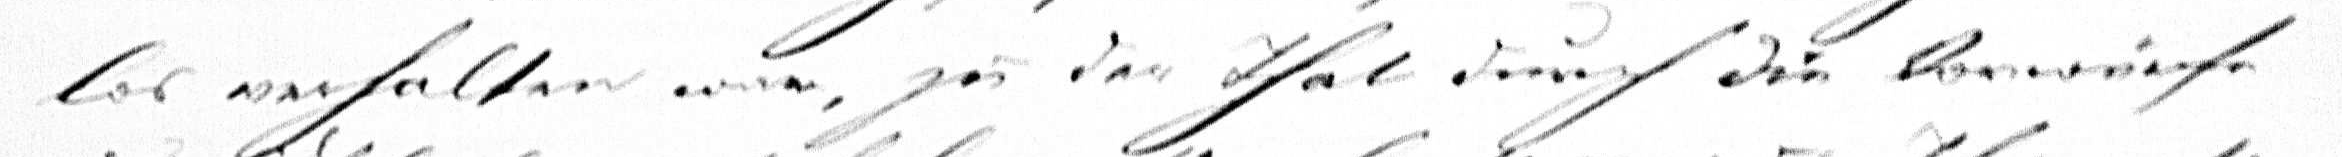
los verhalten war, zu der That durch die Vorwürfe
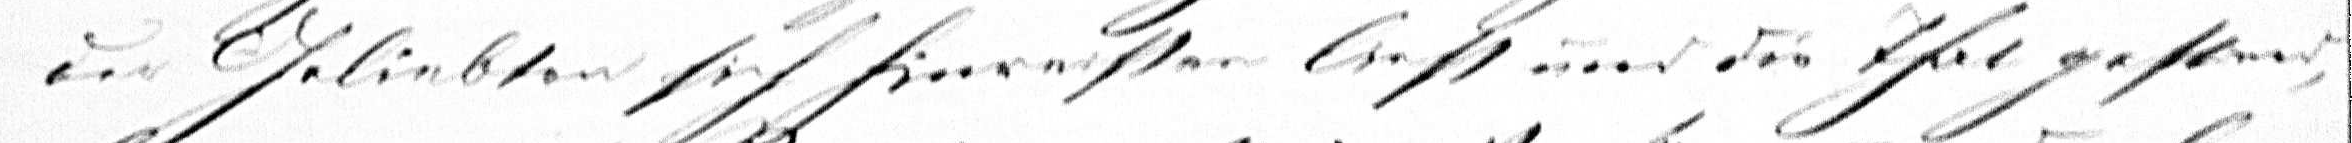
der Geliebten sich hinreißen ließ und die That gestand
